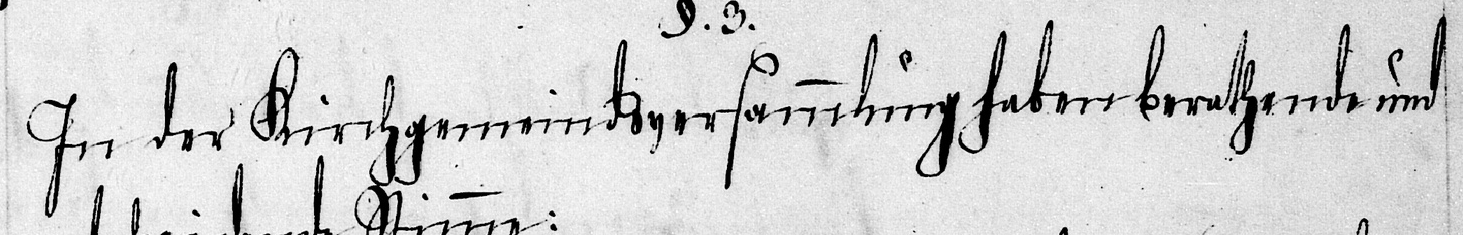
In der Kirchgemeindsversammlung haben berathende und
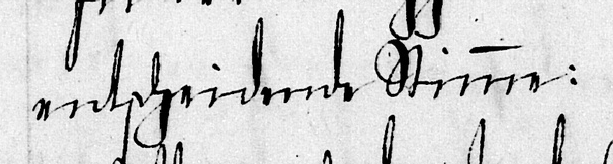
entscheidende Stimme:
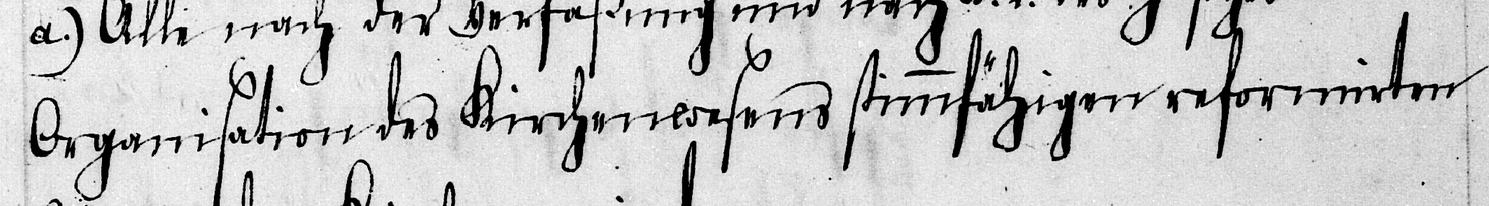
Organisation des Kirchenwesens stimmfähigen reformirten
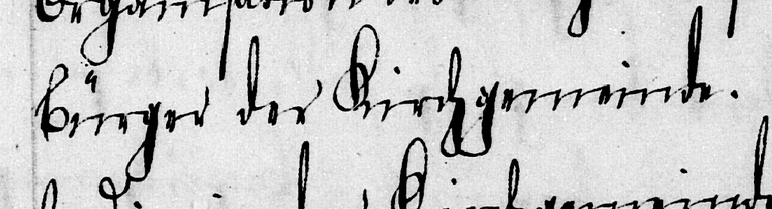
Bürger der Kirchgemeinde.
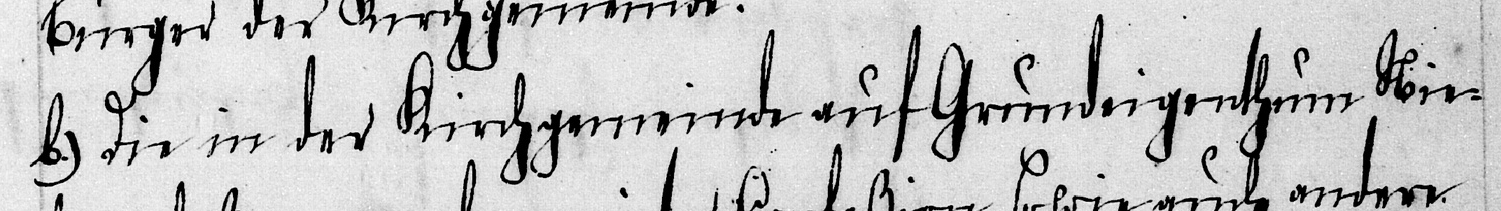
b.) Die in der Kirchgemeinde auf Grundeigenthum Nie¬
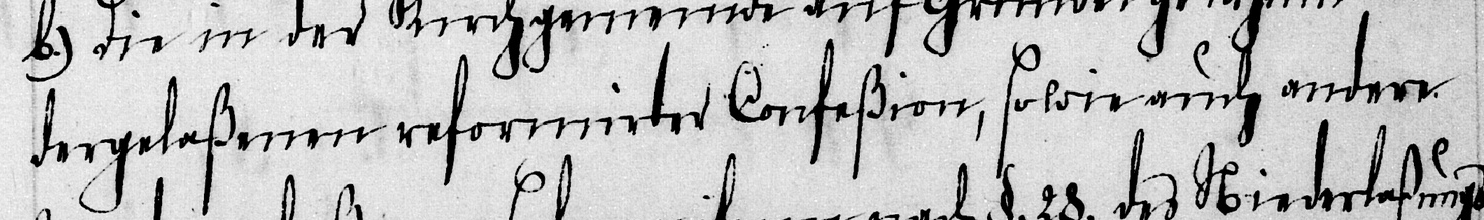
dergelaßenen reformirter Confeßion, sowie auch andere
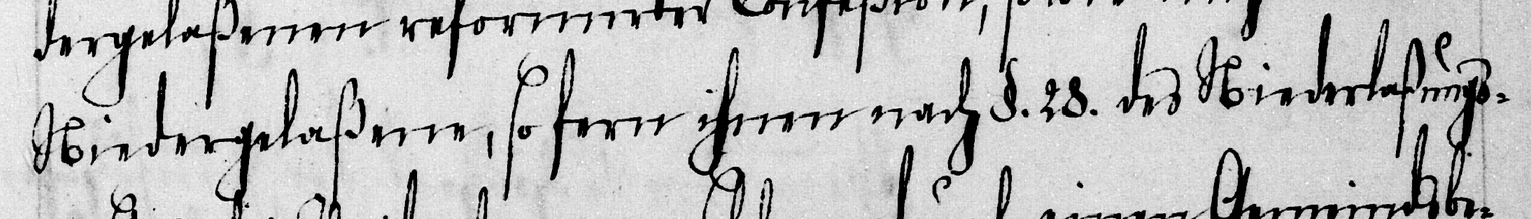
Niedergelaßene, so fern ihnen nach §. 28. des Niederlaßungs¬
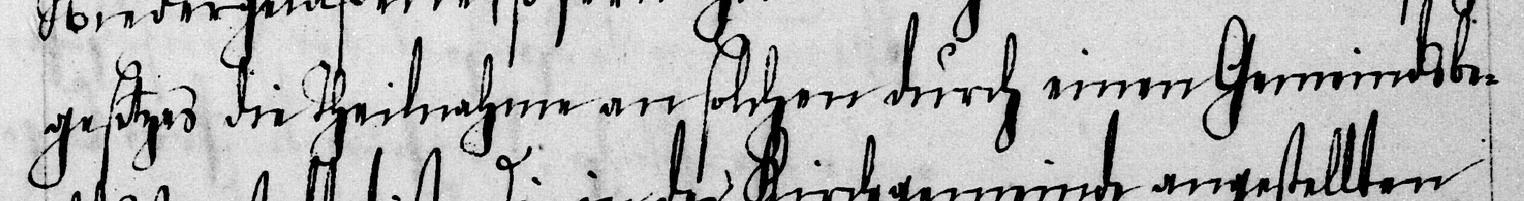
gesetzes die Theilnahme an solchen durch einen Gemeindsbe¬
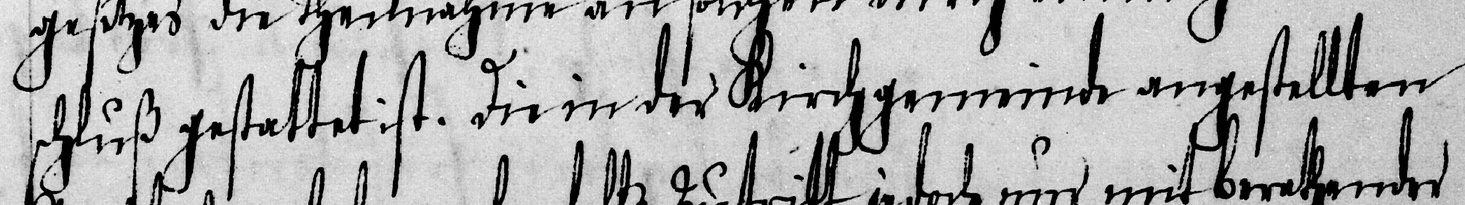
schluß gestattet ist. Die in der Kirchgemeinde angestellten
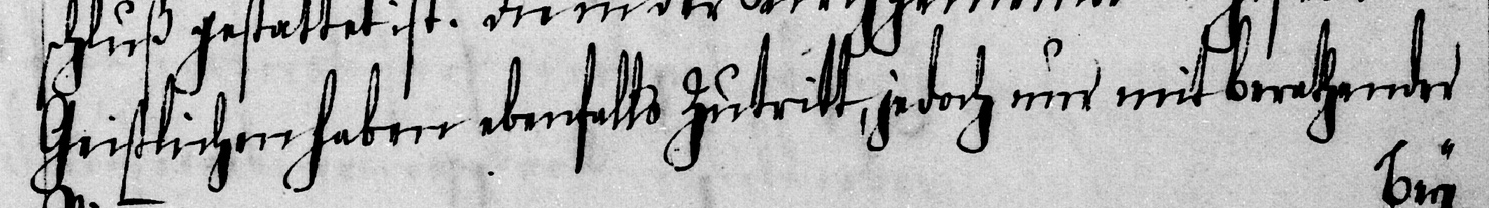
Geistlichen haben ebenfalls Zutritt, jedoch nur mit berathender
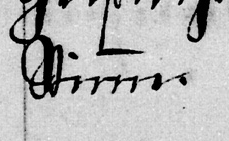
Stimme.
